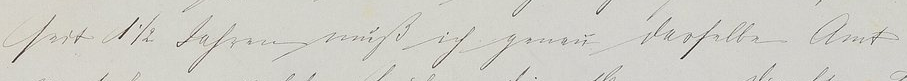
seit 1½ Jahren muß ich genau dasselbe Amt
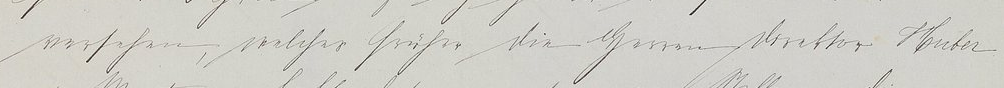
versehen, welches früher die Herren Direktor Huber
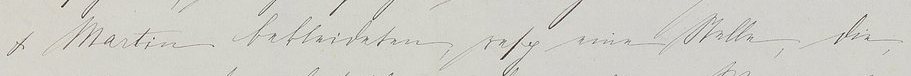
& Martin bekleideten, resp eine Stelle, die,
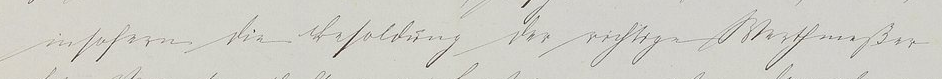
insofern die Besoldung der richtige Werthmeßer
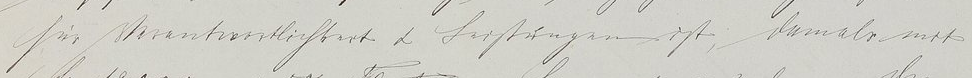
für Verantwortlichkeit & Leistungen ist, damals mit
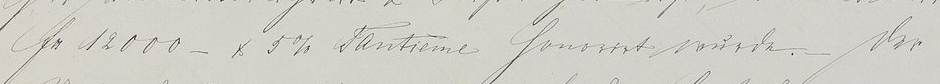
fr 12000 – & 5% Tantième honorirt wurde. – Der
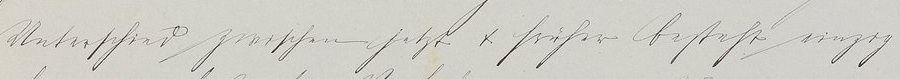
Unterschied zwischen jetzt & früher besteht einzig
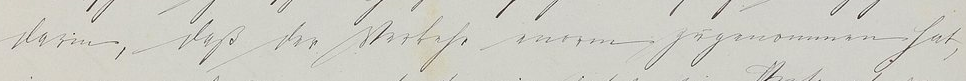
darin, daß der Verkehr enorm zugenommen hat,
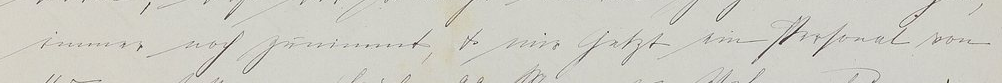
immer noch zunimmt, & mir jetzt ein Personal von
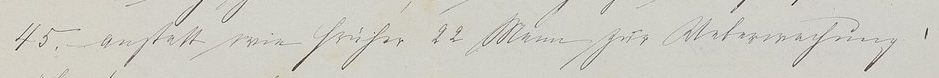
45. anstatt wie früher 22 Mann zur Ueberwachung
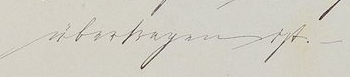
übertragen ist. –
